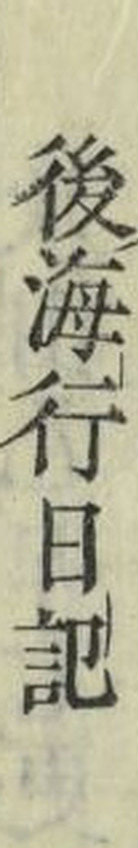後海-行日-記
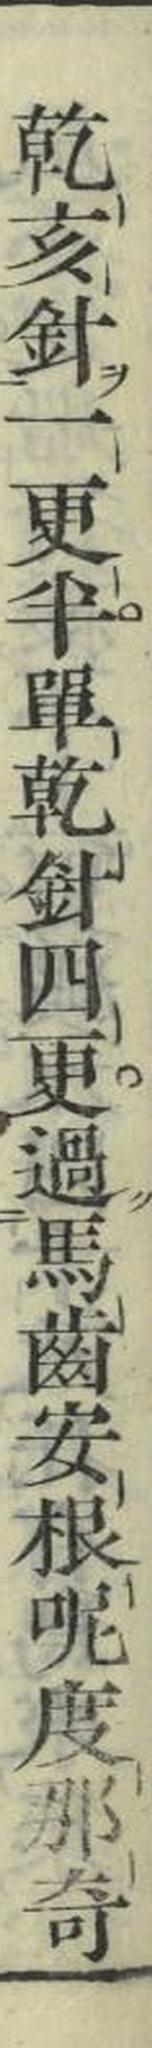乾-亥-針一-更-半。單-乾-針四-更。過馬-齒安-根-呢度-那-奇
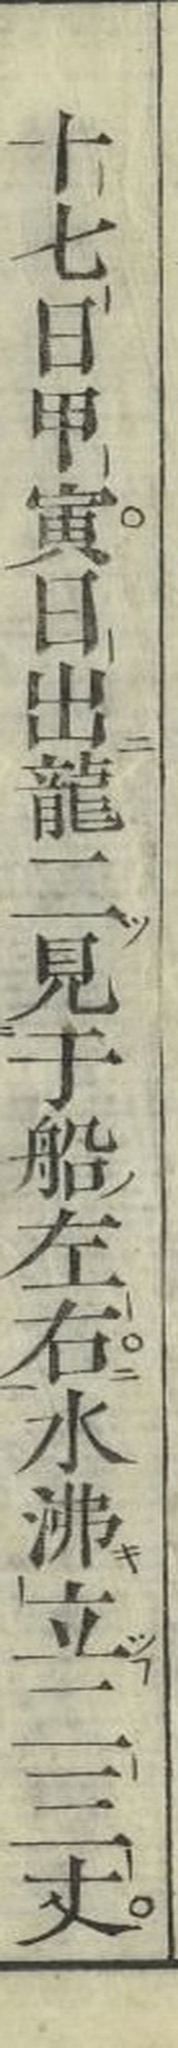十-七-日甲-寅。日-出龍二見于船左-右。水沸-立ヿ二-三-丈。

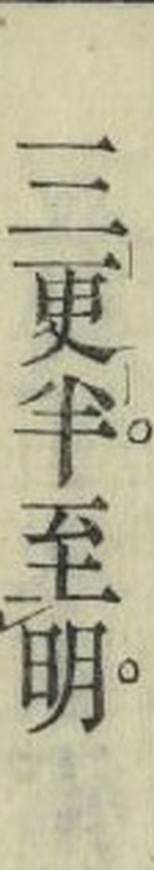三-更-半。至明。
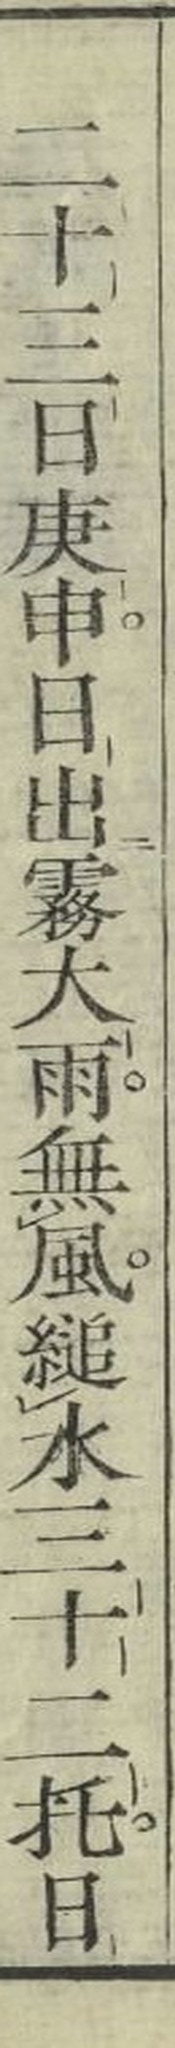二-十-三-日庚-申。日-出霧大-雨。無風。縋水三-十-二-托。日-

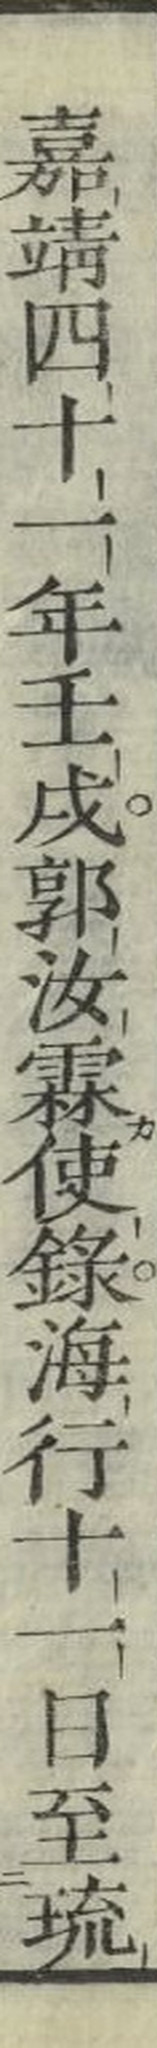嘉-靖四-十-一-年壬-戌。郭-汝-霖使-錄。海-行十-一-日至琉-

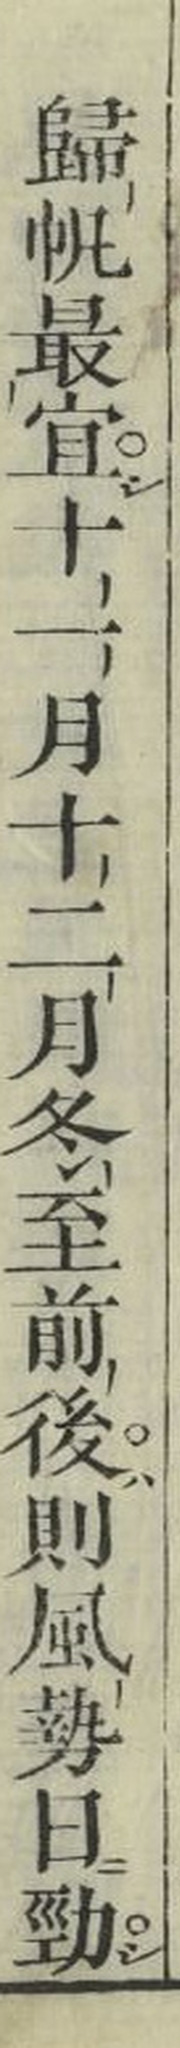歸-帆最-宜。十-一-月十-二-月冬-至前-後。則風-勢日勁。

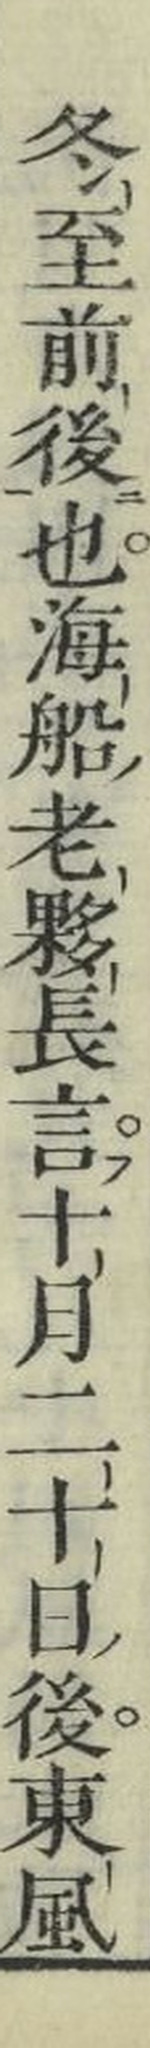冬-至前-後也。海-船老-夥-長言。十-月二-十-日後。東-風

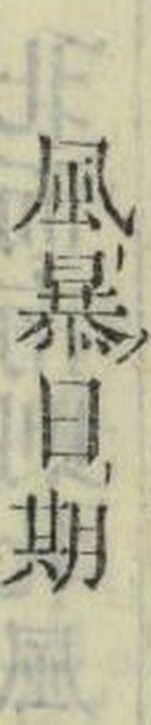風-暴日-期
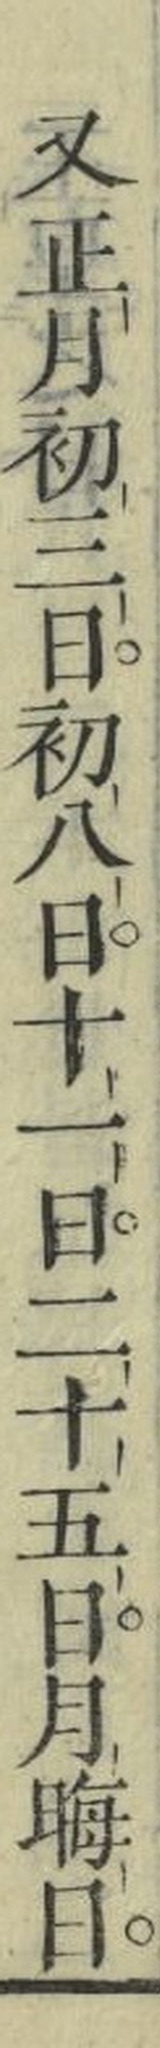又正-月初-三-日。初-八-日。十-一-日。二-十-五-日。月-晦-日。

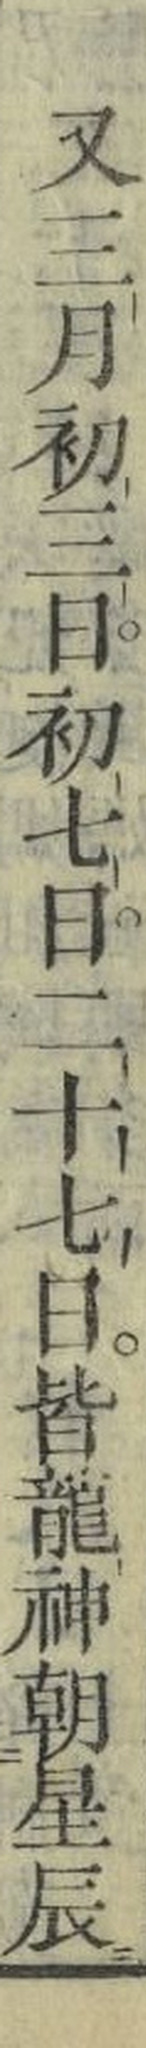又三-月初-三-日。初-七-日。二-十-七-日。皆龍-神朝星辰
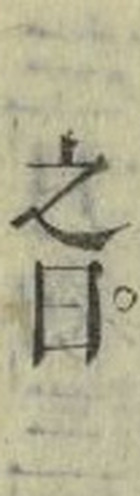之日。
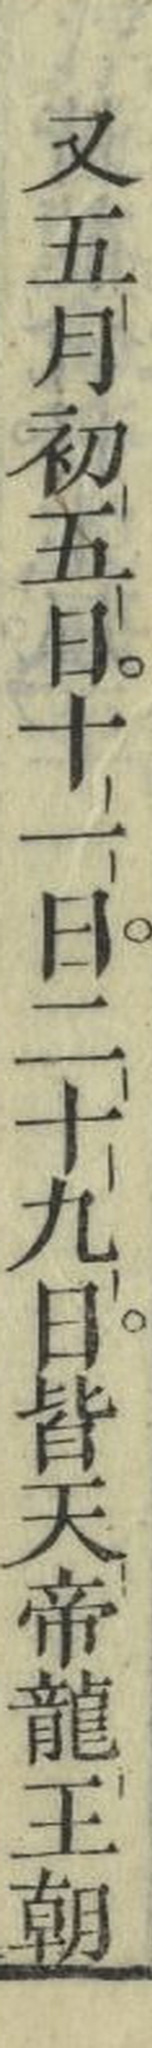又五-月初-五-日。十-一-日。二-十-九-日。皆天-帝龍-王朝
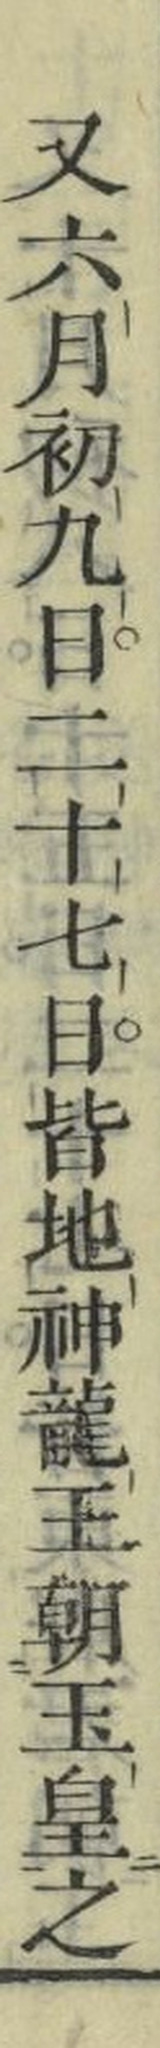又六-月初-九-日。二-十-七-日。皆地-神龍-王朝玉-皇之
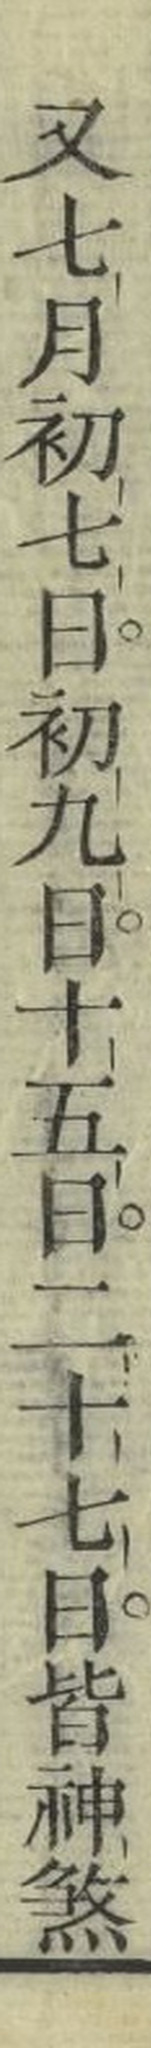又七-月初-七-日。初-九-日。十-五-日。二-十-七-日。皆神-煞
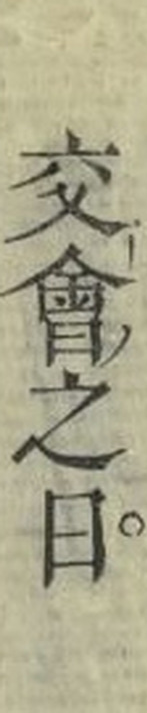交-會之日。
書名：中山伝信録 巻一
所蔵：University of the Ryukyus Library
